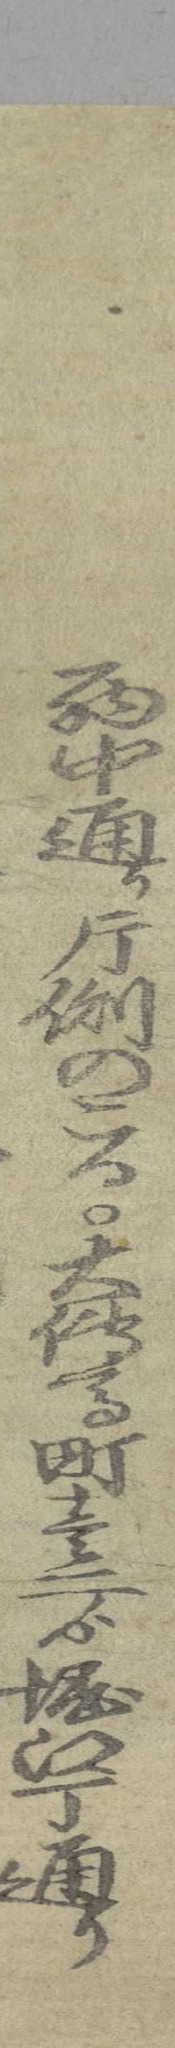西中通り片側のこる○大伝馬町一二より堀江丁通り
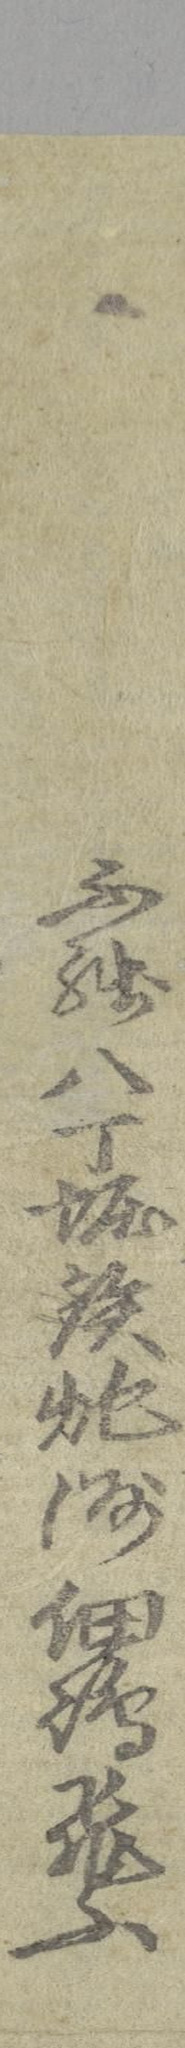不残八丁堀鉄砲洲佃島飛ふ
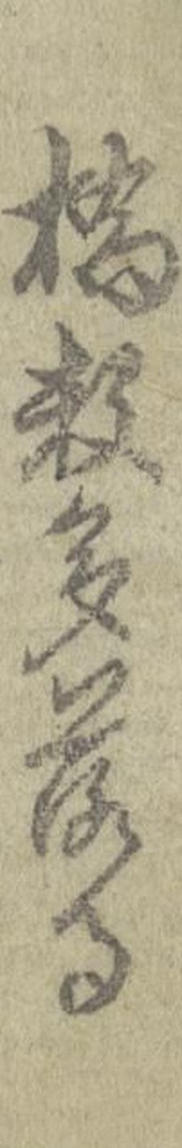橋数多落る
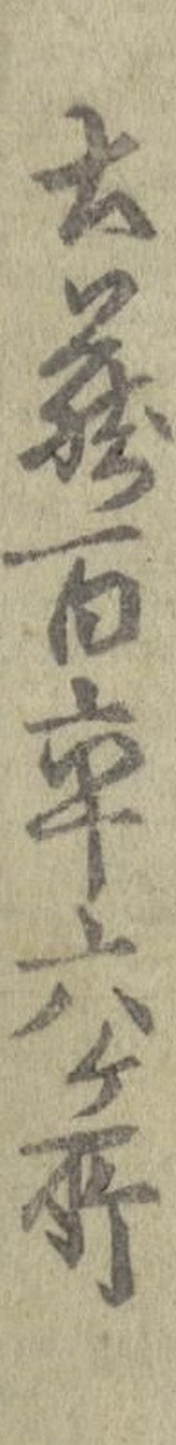土蔵百六十六ケ所
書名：[弘化三年一月の江戸大火に関する瓦版]
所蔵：東京大学地震研究所図書室 Earthquake Research Institute Library, The University of Tokyo, JAPAN
